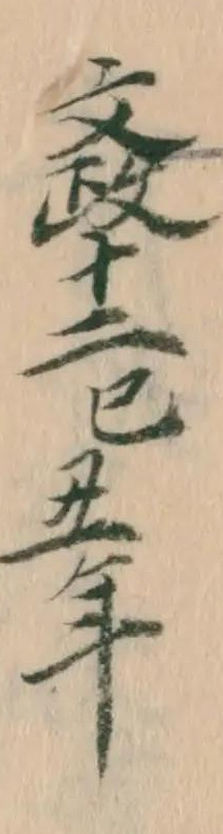文政十二巳丑年
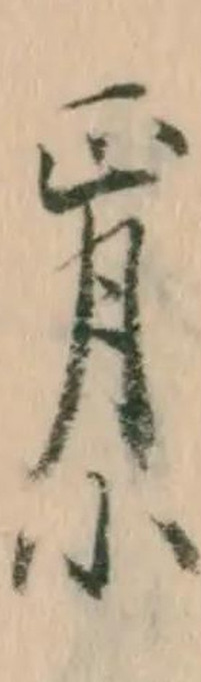正月小
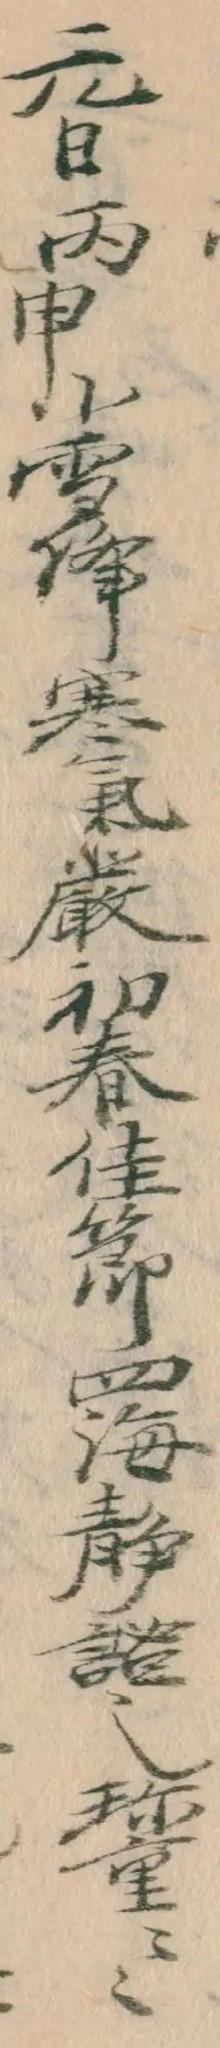元日丙申小雪降寒氣厳初春佳節四海静謐之珍重々々
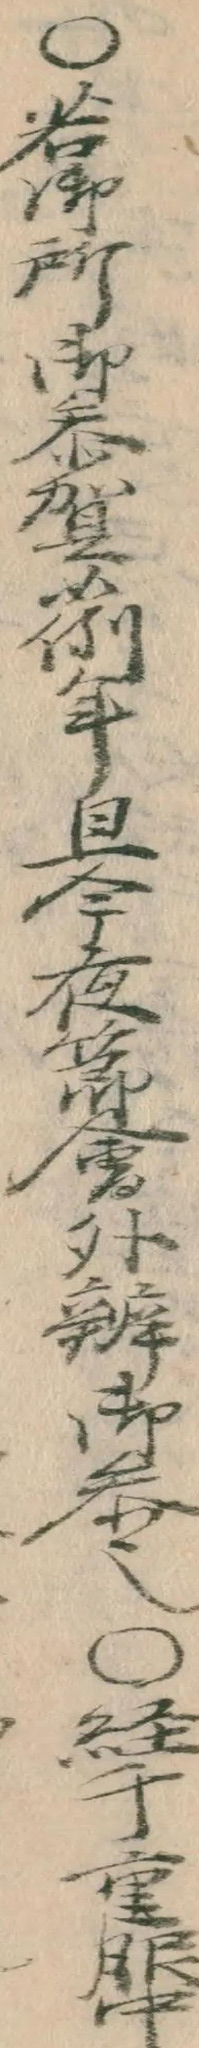○若御所御参賀如例年且今夜節會外辨御参也○経千重服中
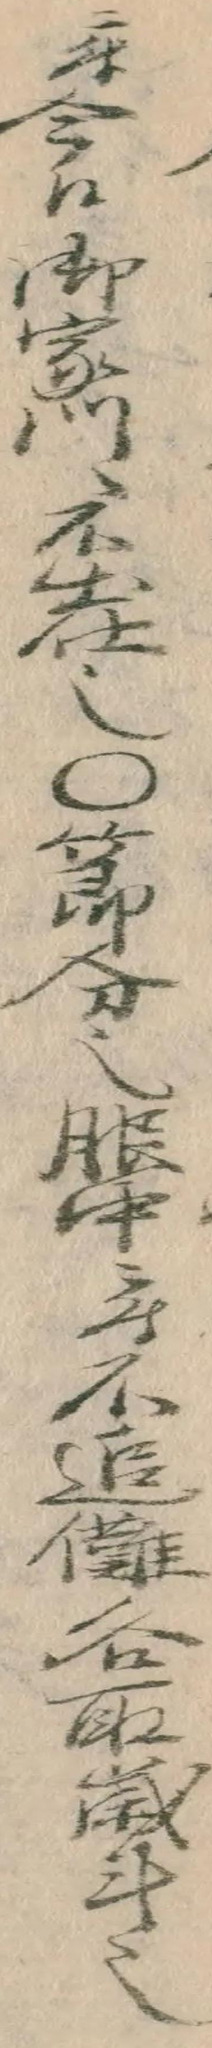ニ付今日御家門へ不出仕也○節分也服中ニ付不追儺各取歳斗也
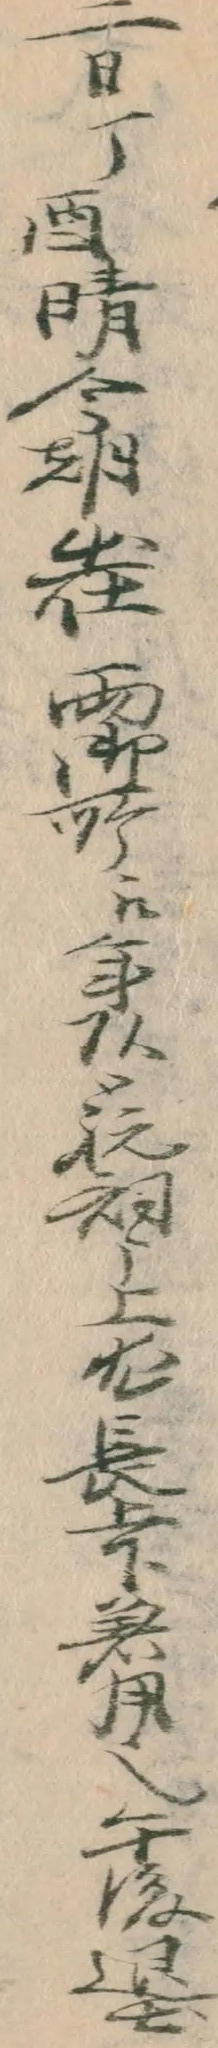二日丁酉晴今朝出仕両御所え年頭御祝詞申上尤長上下着用也午後退出
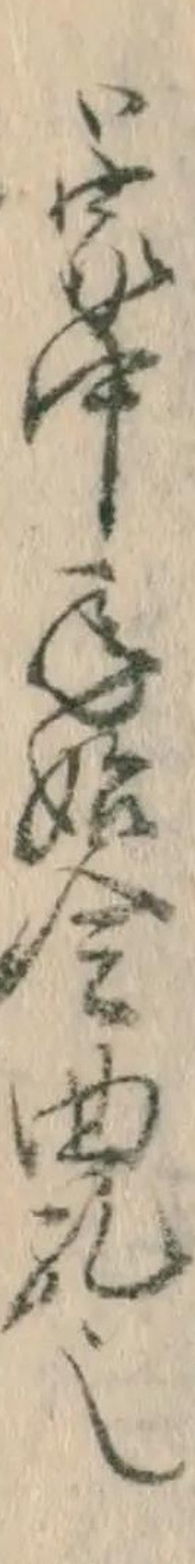御家中年始令回礼也
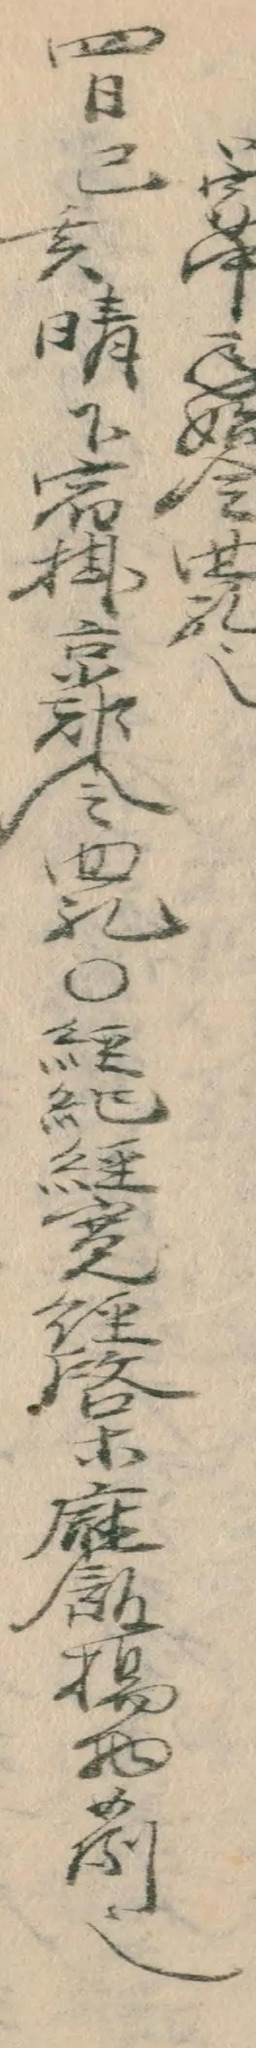四日己亥晴下宿掛京都令回礼○経紀経寛経啓等廰飯揚物如例也
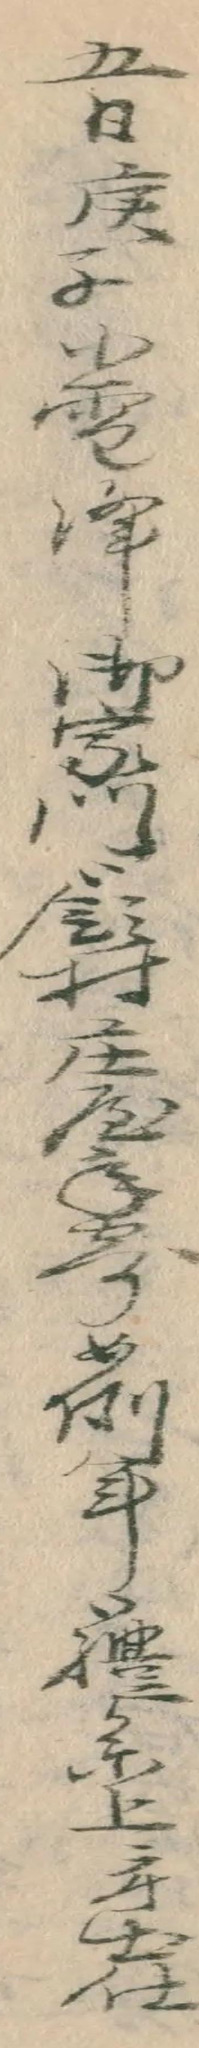五日庚子小雹降御家門御領村庄屋手寄如例斗御禮被参上ニ付出仕
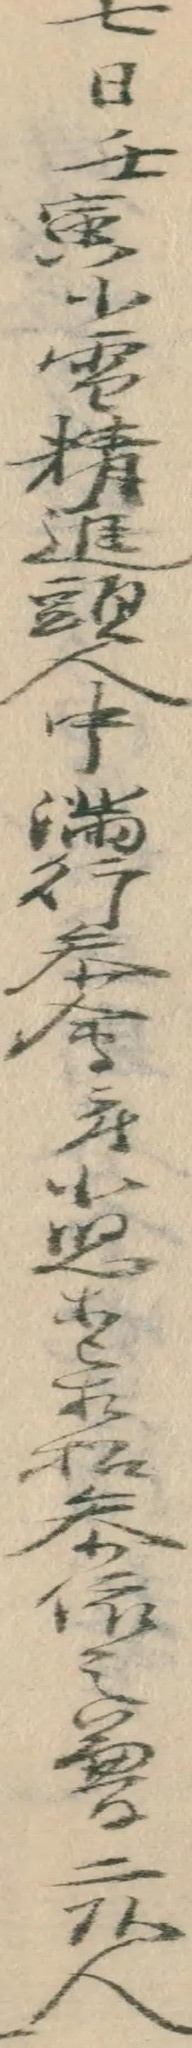七日壬寅小雪精進頭人中満行参會ニ付小児等被相招参依之兼日二頭人
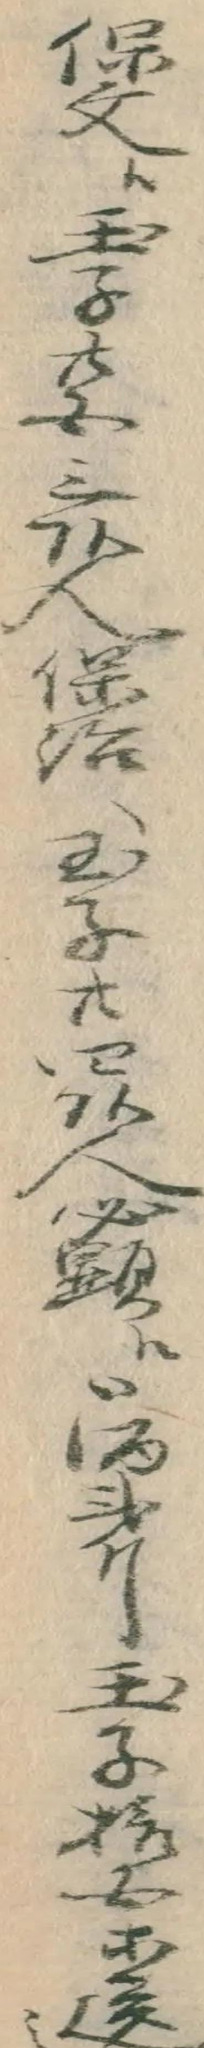保文江玉子廿五三弐人保治へ玉子廿四頭人必顕江御酒弐升玉子拾五等送之

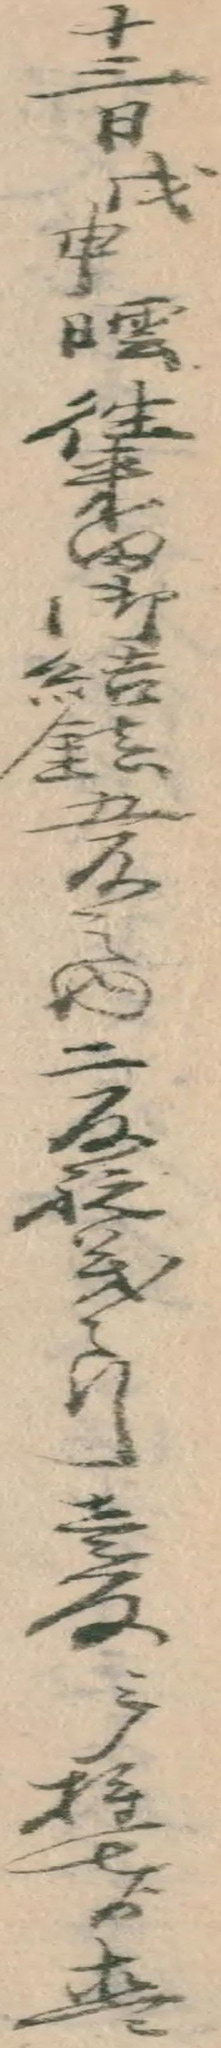十三日戊申曇往来田御結鎮五反之内二反祝義之引壱反ニテ経千ゟ直ニ
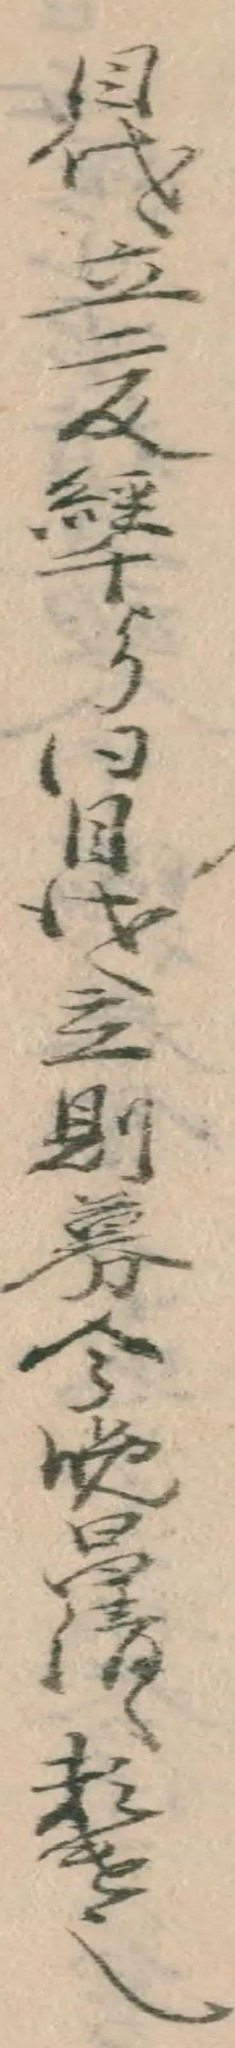目代へ立二反経千より同目代ヘ立則募今晩昌清へ頼遣也
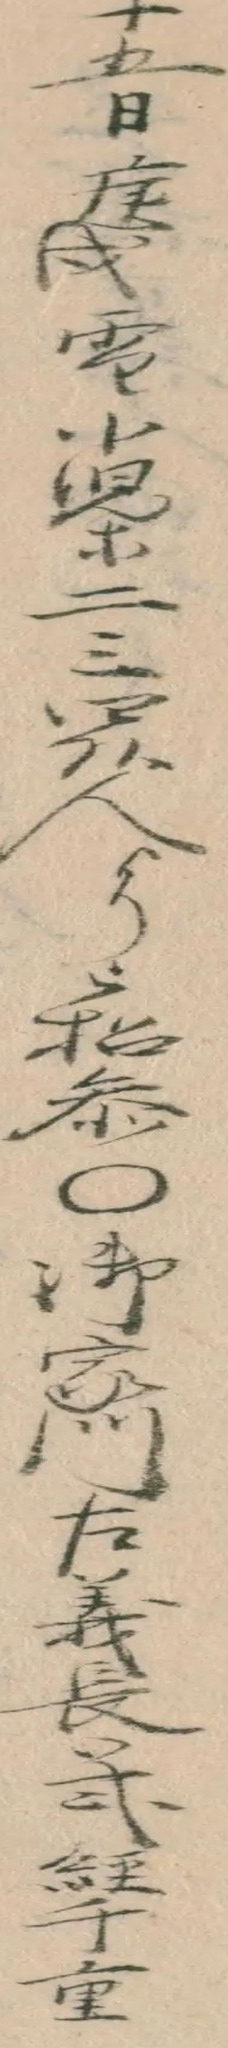十五日庚戌雪小児等二三四頭人より被招参〇御家門左義長御式経千重
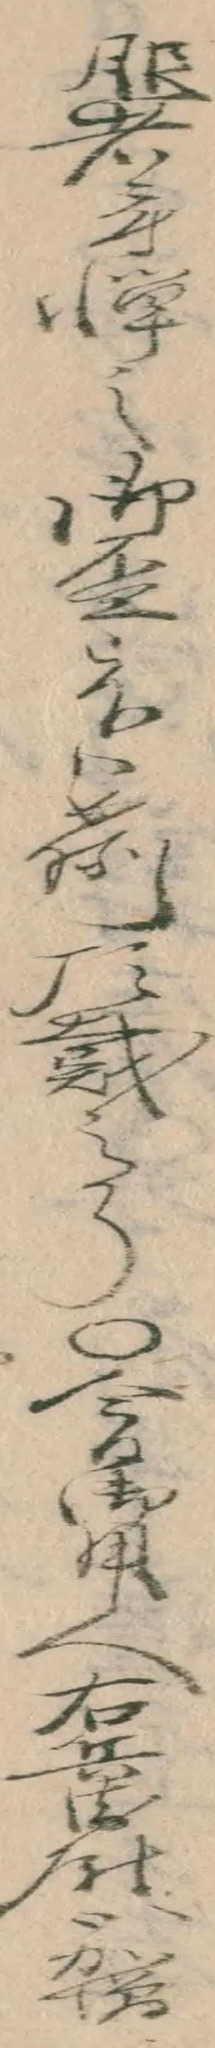服者ニ付憚也御盃被下候如例頂戴之了○今日御用人右兵衛尉へ御加増
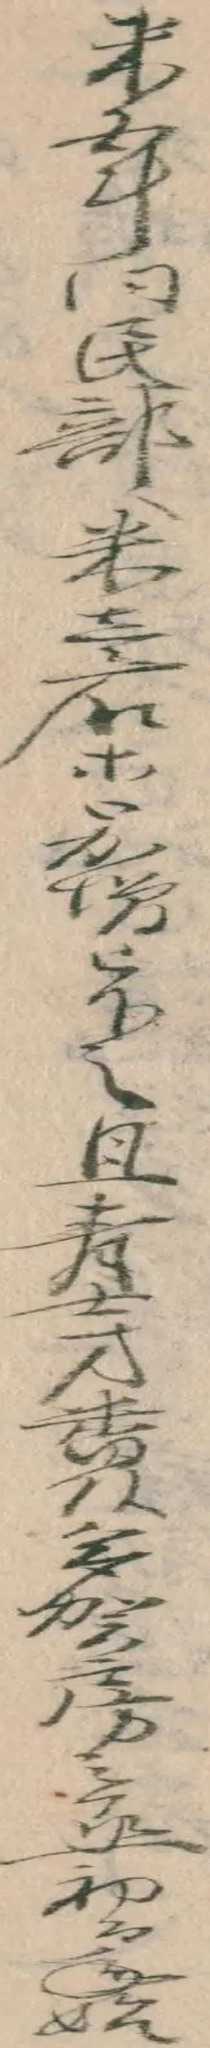米五斗同民部へ米壱石等御加増被下之且青士方番頭多賀房家初而年始
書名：賀茂社記録. 第65冊
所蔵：国立国会図書館 National Diet Library, JAPAN
